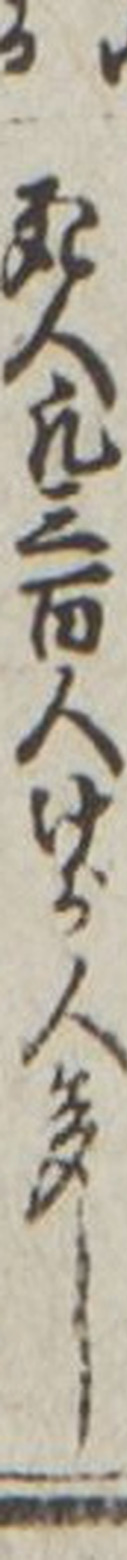死人凡三百人けかに多し
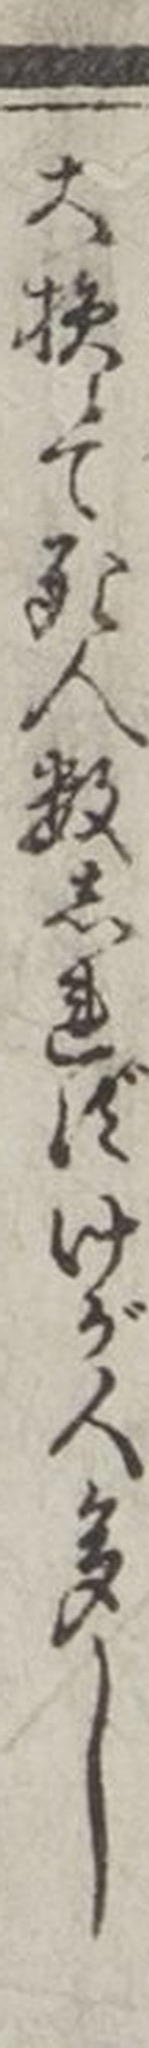大損にて死人数しれずけが人多し
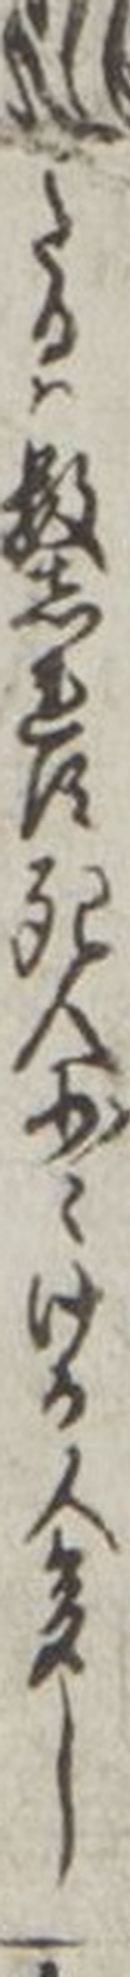たるは数しれす死人少々けか人多し
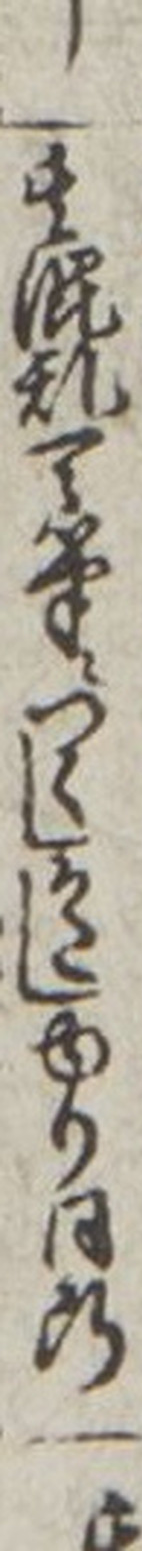其混乱一々筆につくしがたしゆり同断
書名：嘉永七年寅十一月諸国大地震大津波并出火
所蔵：あいおいニッセイ同和損保株式会社
